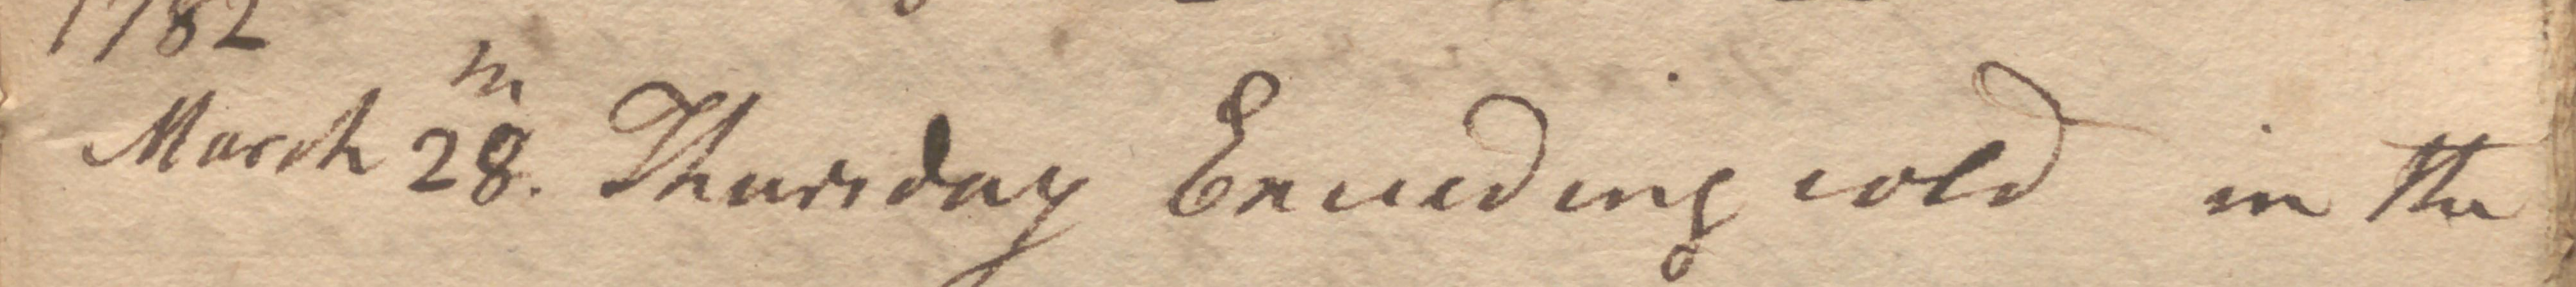March 28^th. Thursday Exceeding cold, in the
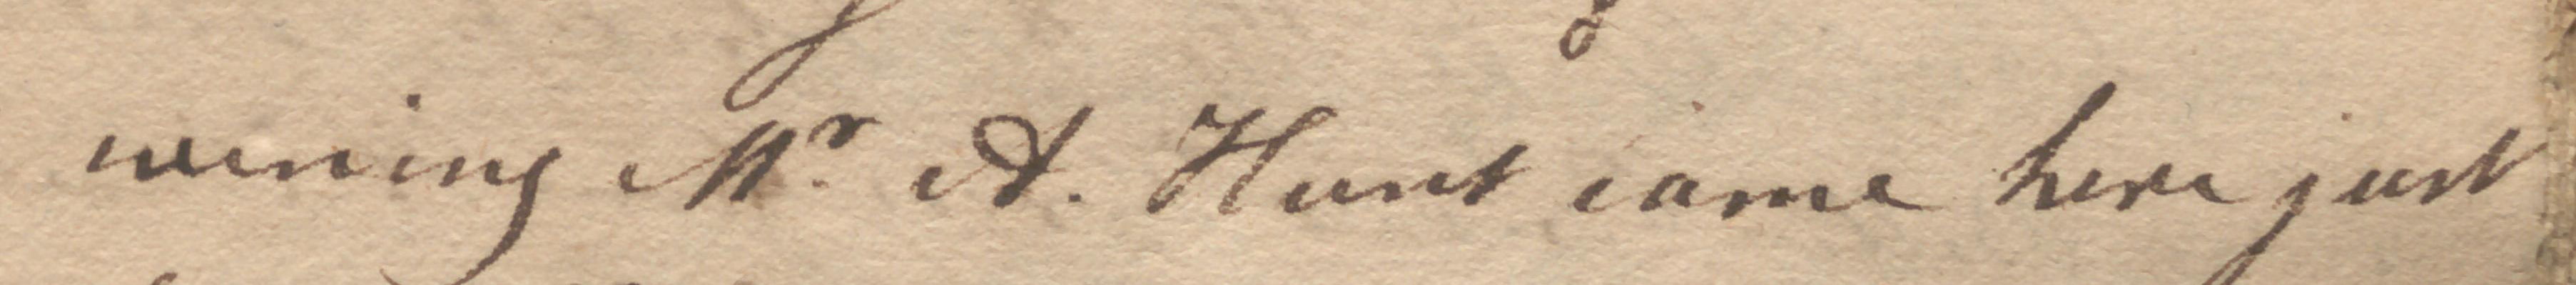evening M^r. A. Hunt came here just
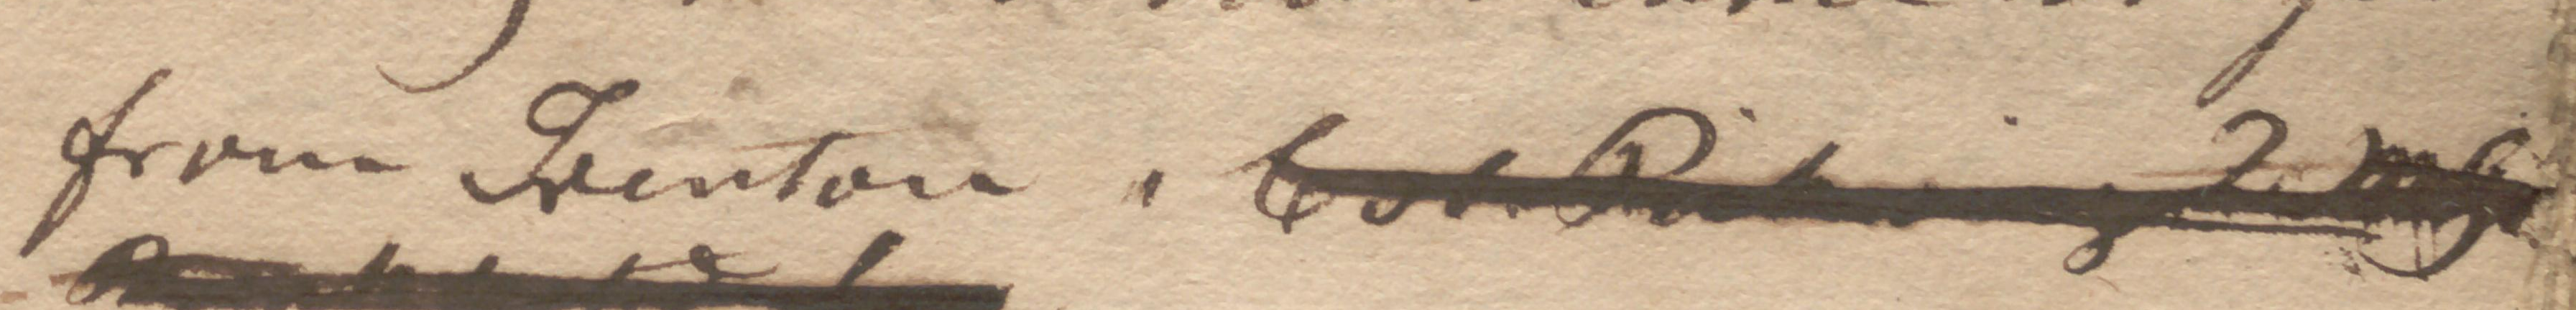from Trenton, [Col. Pickering QMG]
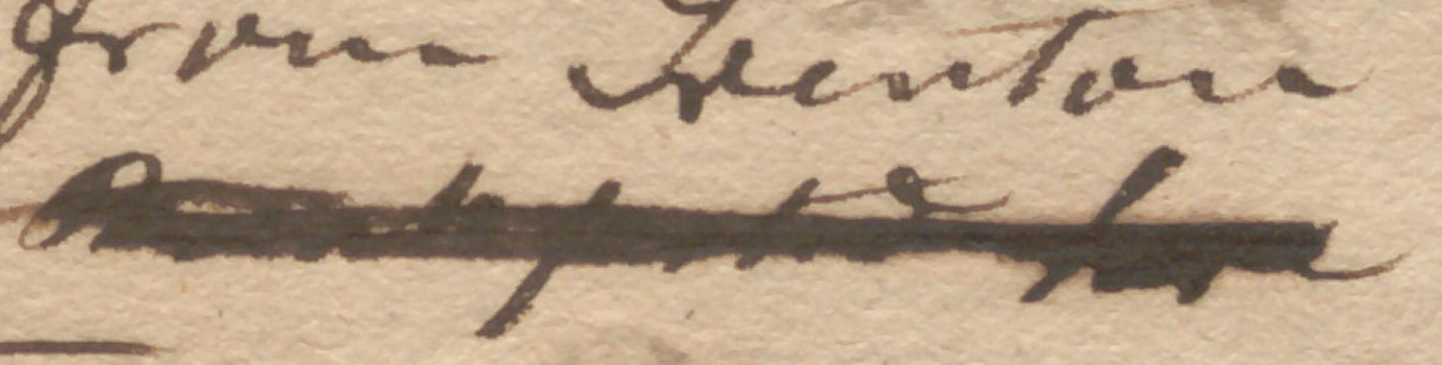[Breakfasted here]
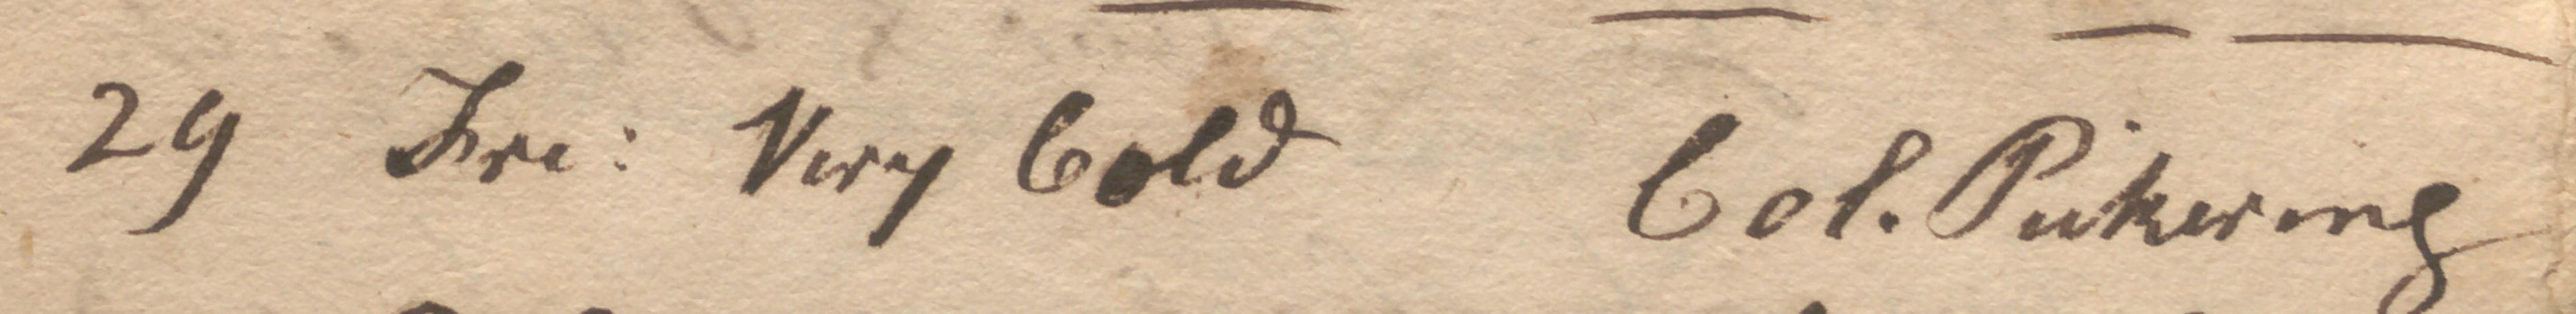29 Fri: Very Cold Col. Pickering
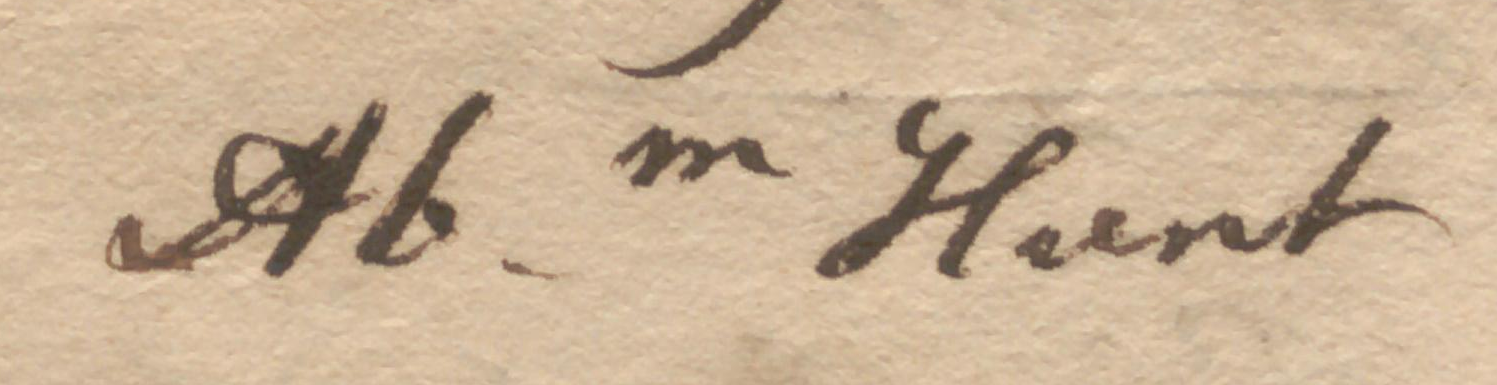Ab^m Hunt
